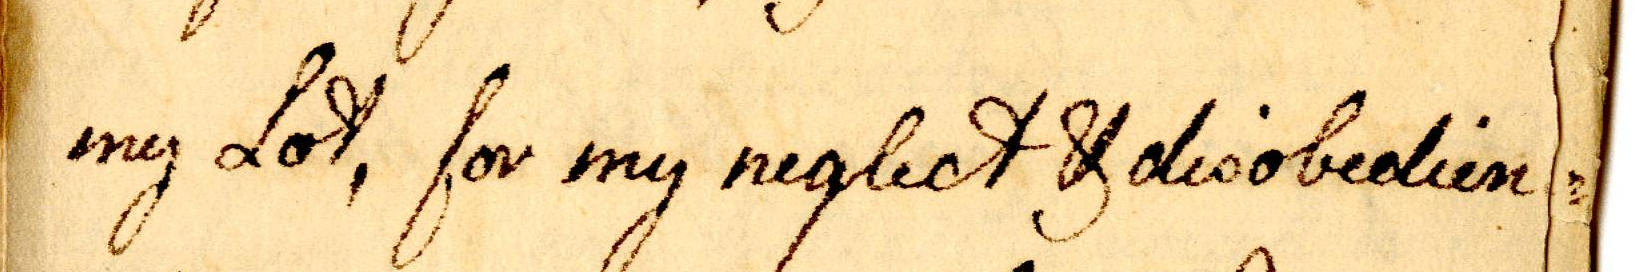my Lot, for my neglect & disobedien
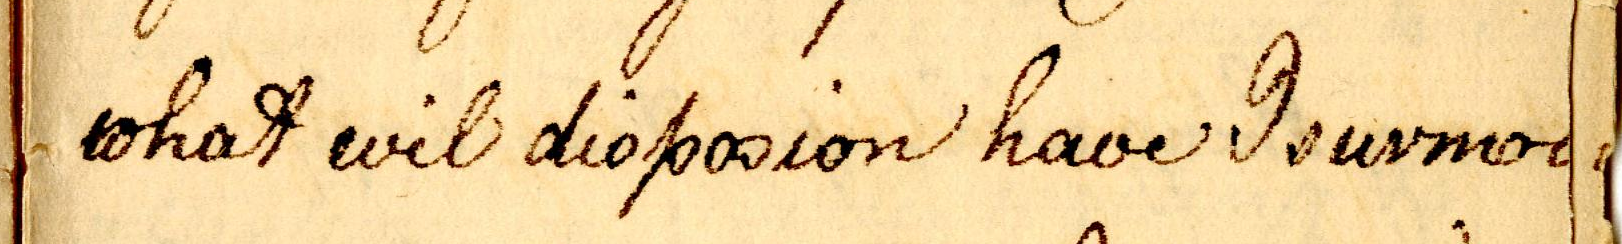what evil disposion have I surmou
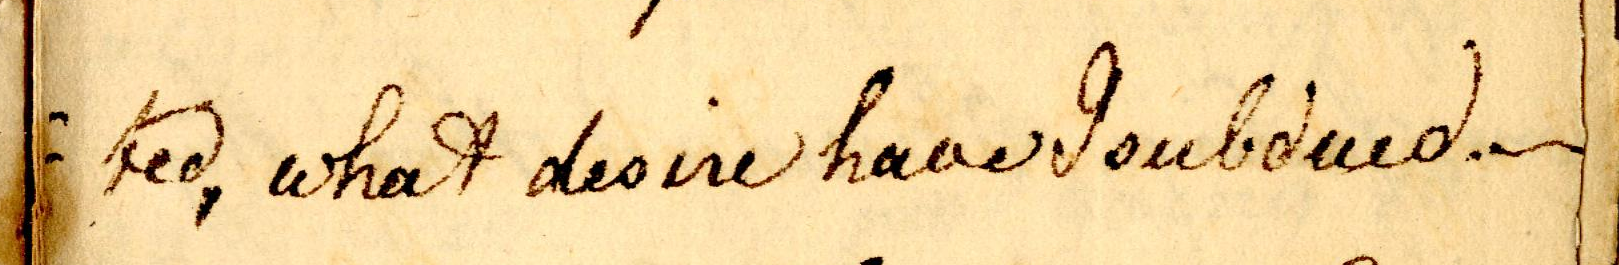-ted, what desire have I subdued-
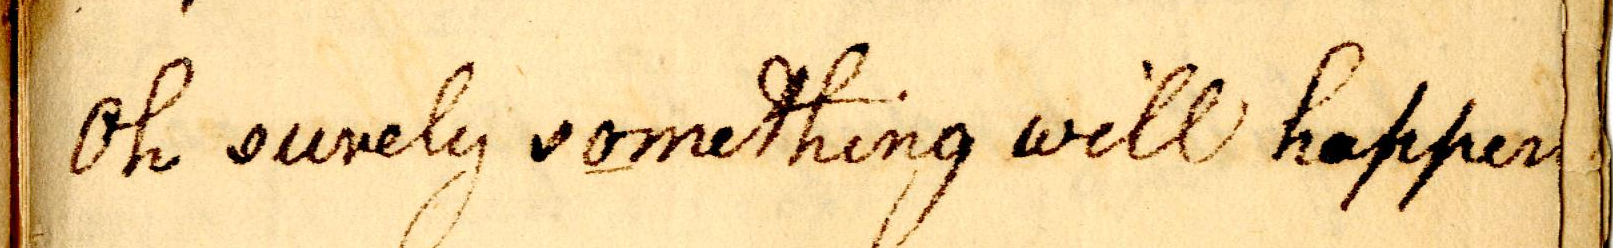Oh surely something will happen
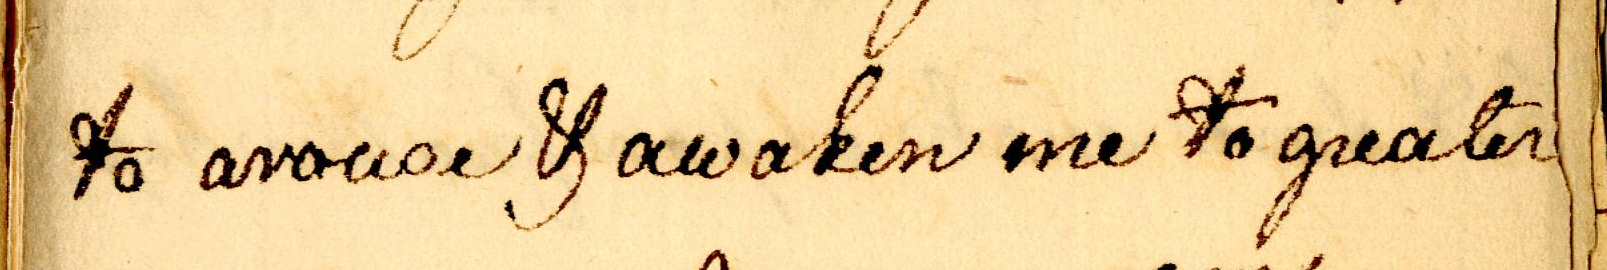to arouse & awaken me to greater
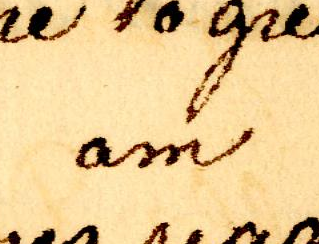am
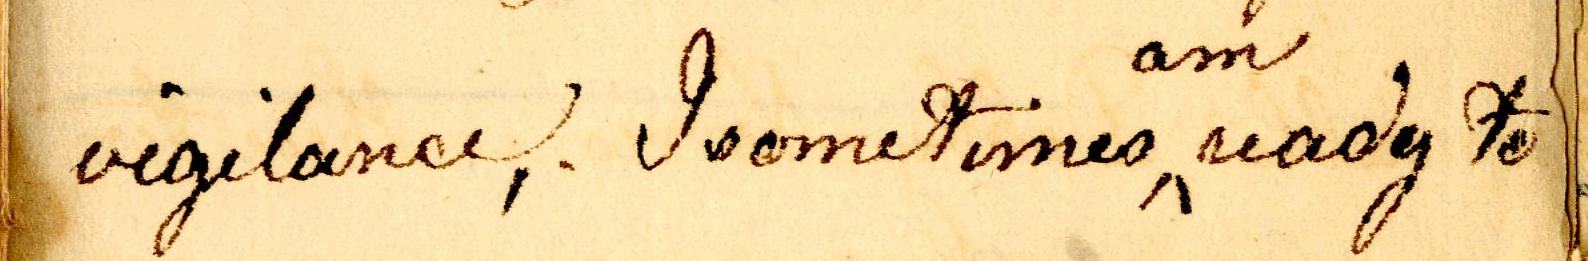vigilance, I sometimes ^ ready to
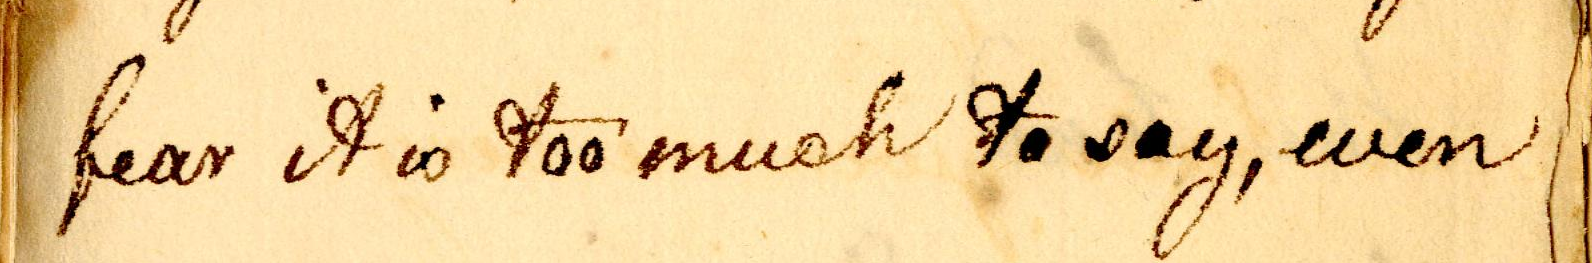fear it is too much to say, even
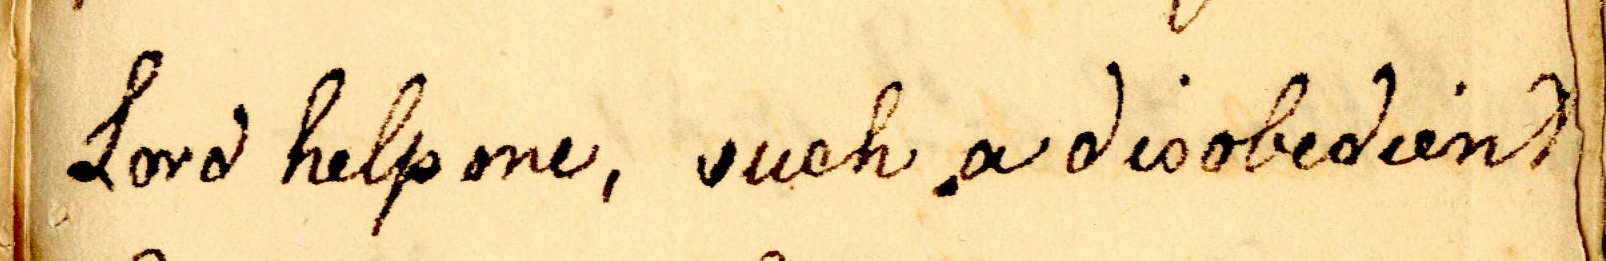Lord help me, such a disobedient
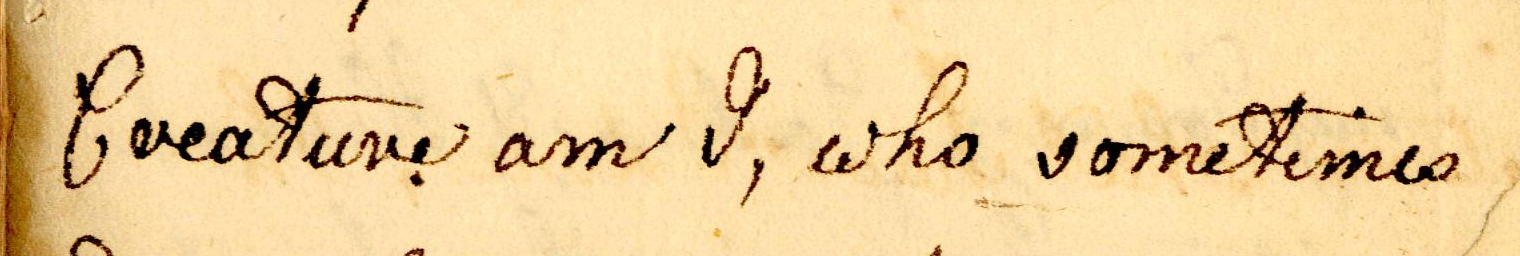Creature am I, who sometimes
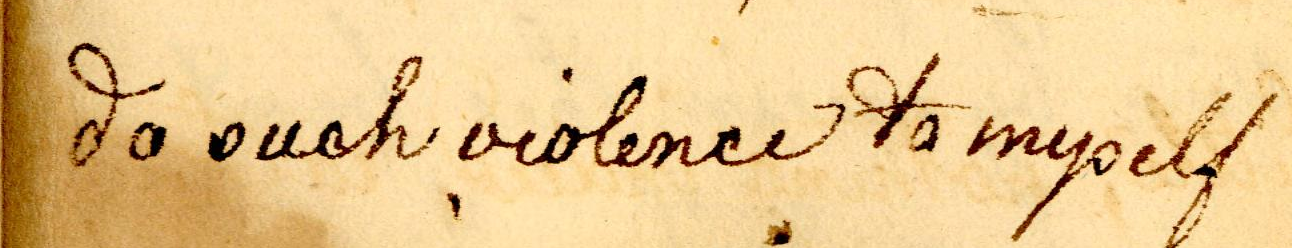do such violence to myself
